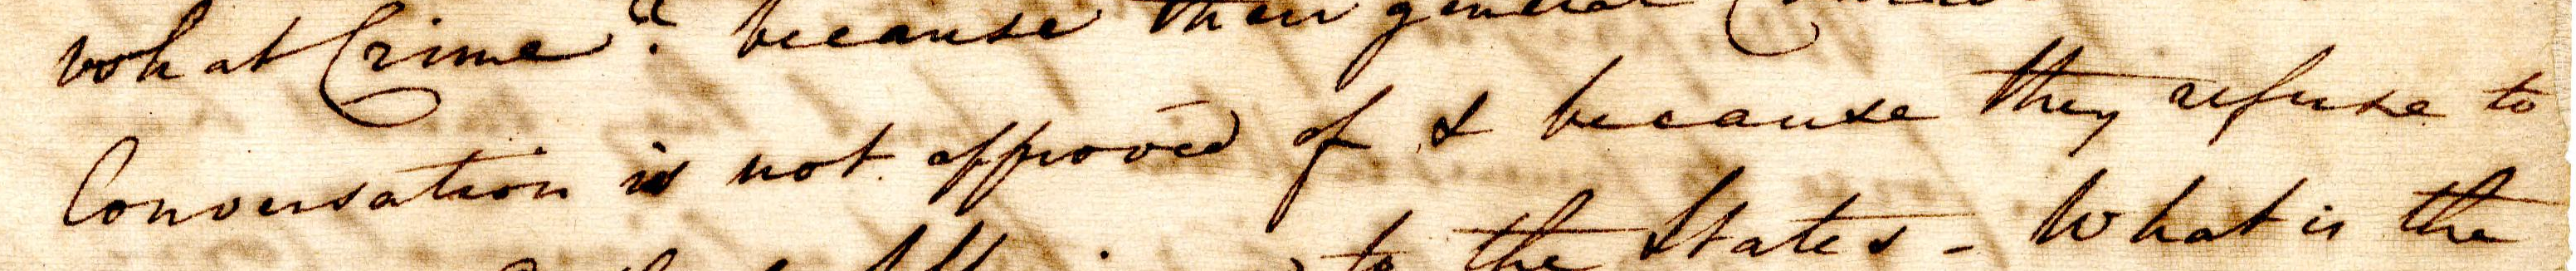Conversation is not approved of & because they refuze to
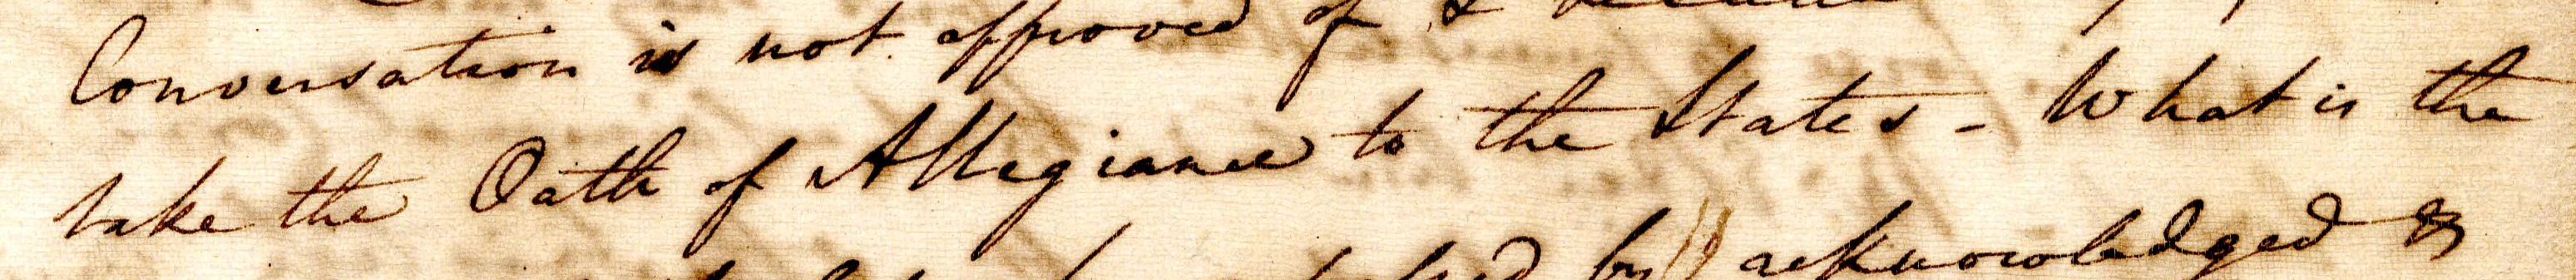take the Oath of Allegiance to the States. What is the
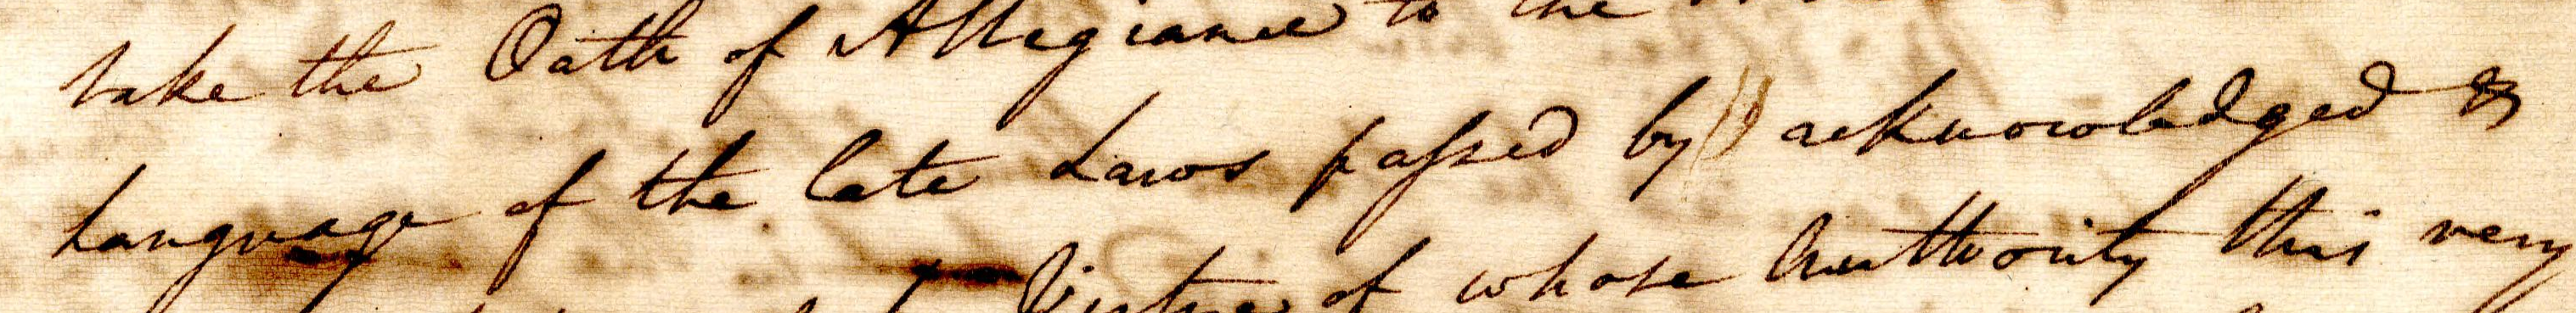Language of the late Laws passed by acknowledged &
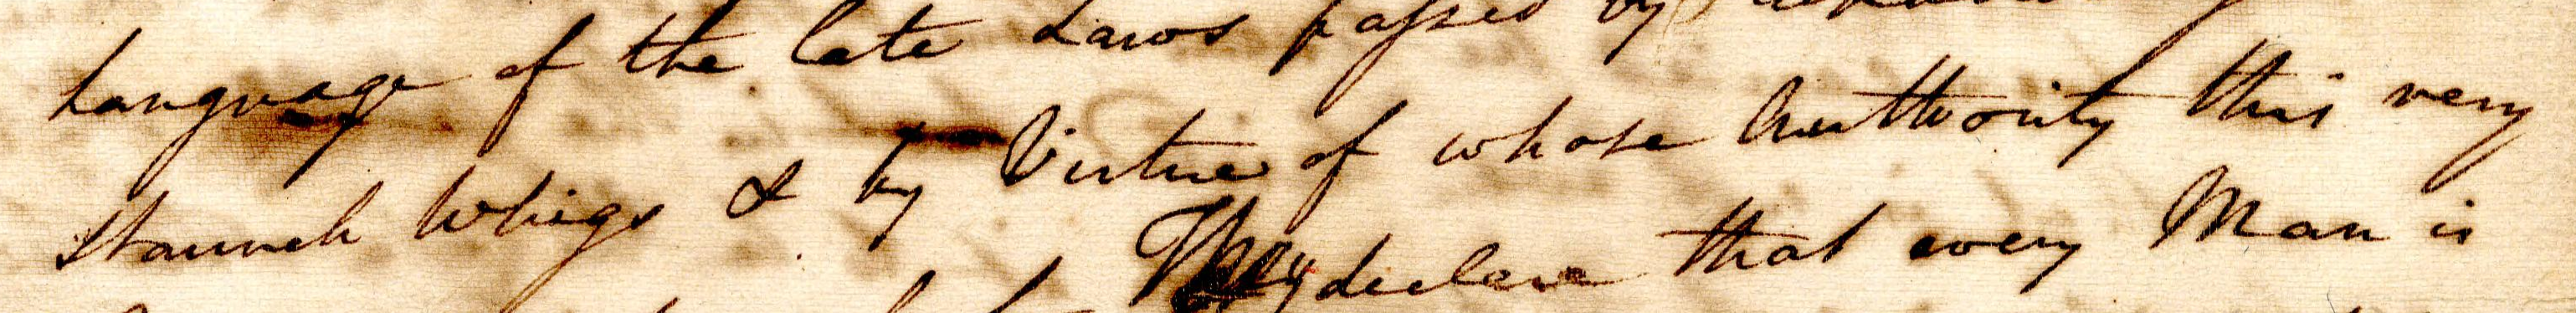staunch Whigs & by Virtue of whose Authority this very
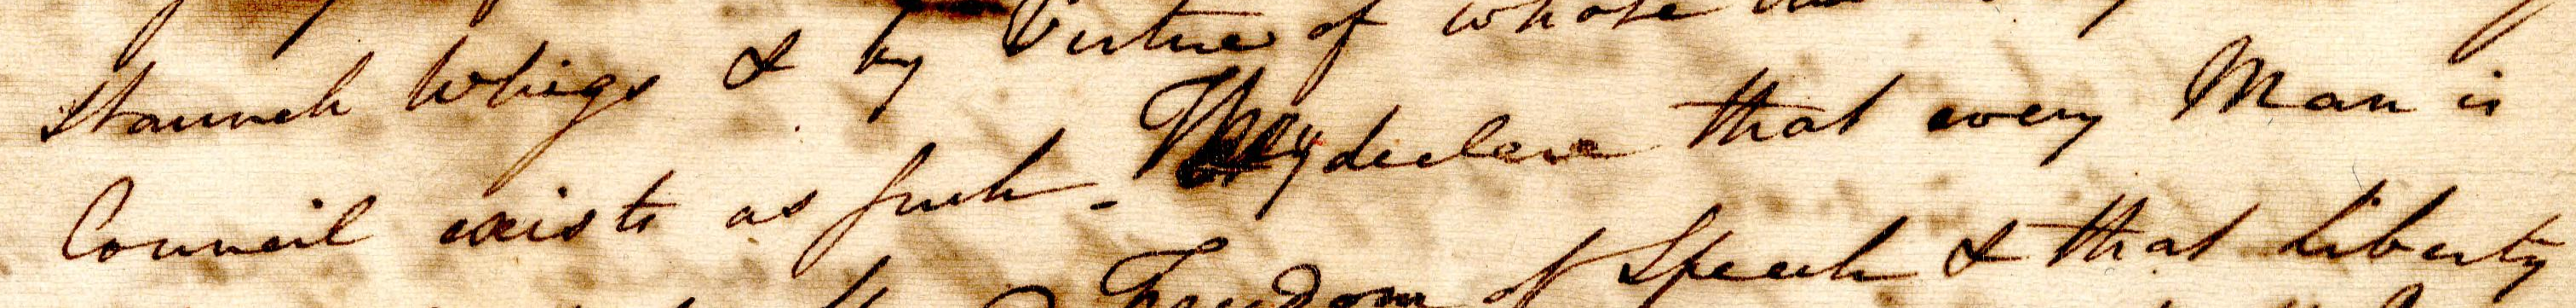Council exists as such. They declare that every Man is
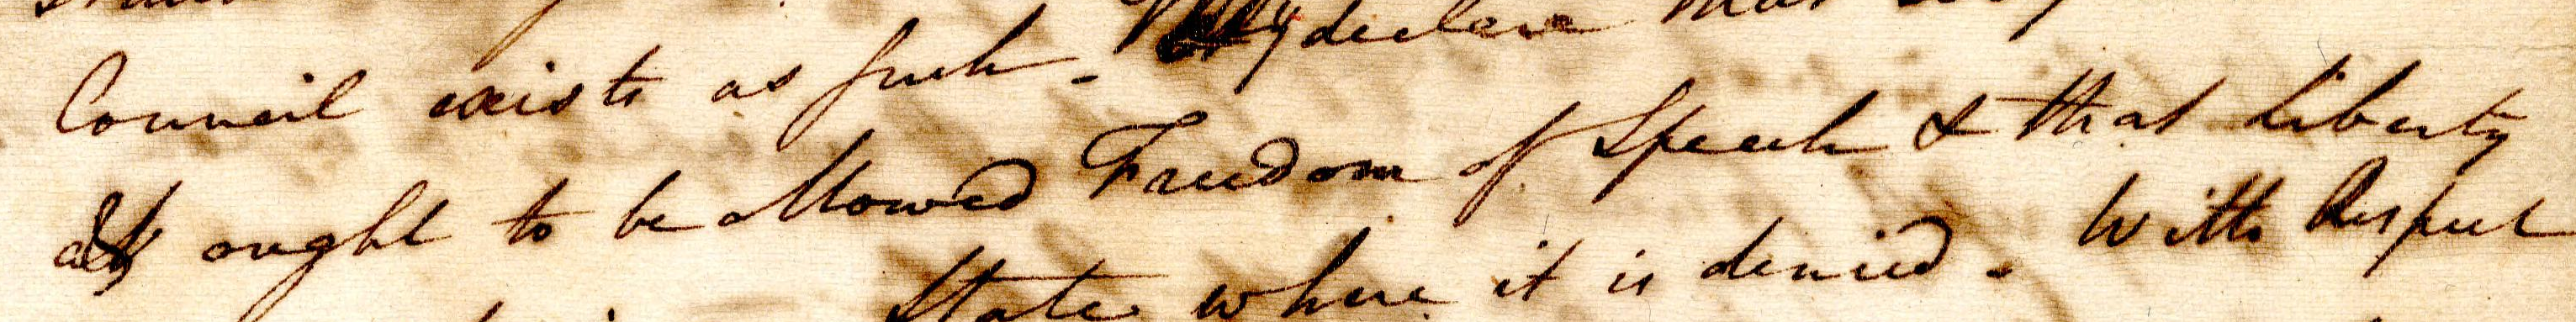& ought to be allowed Freedom of Speech & that Liberty
